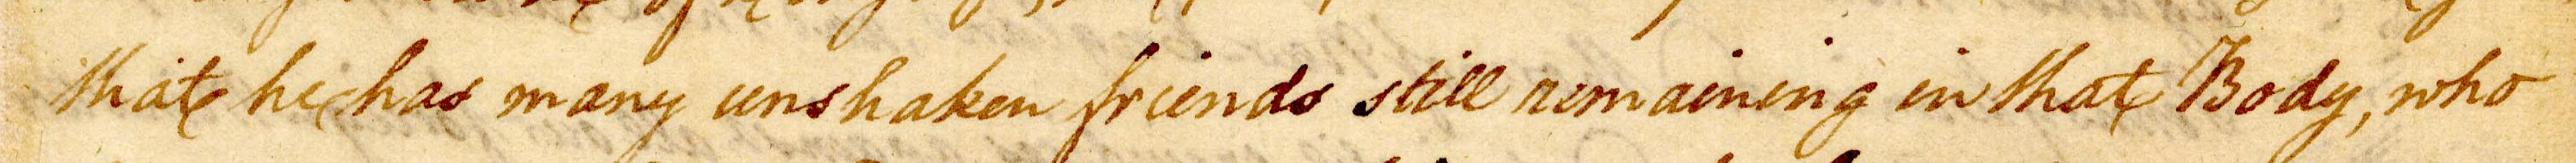that he has many unshaken friends still remaining in that Body, who
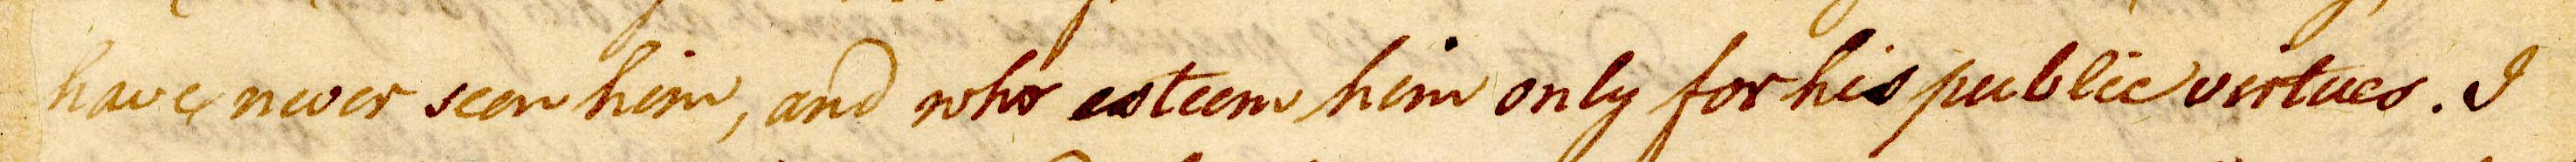have never seen him, and who esteem him only for his public virtues. I
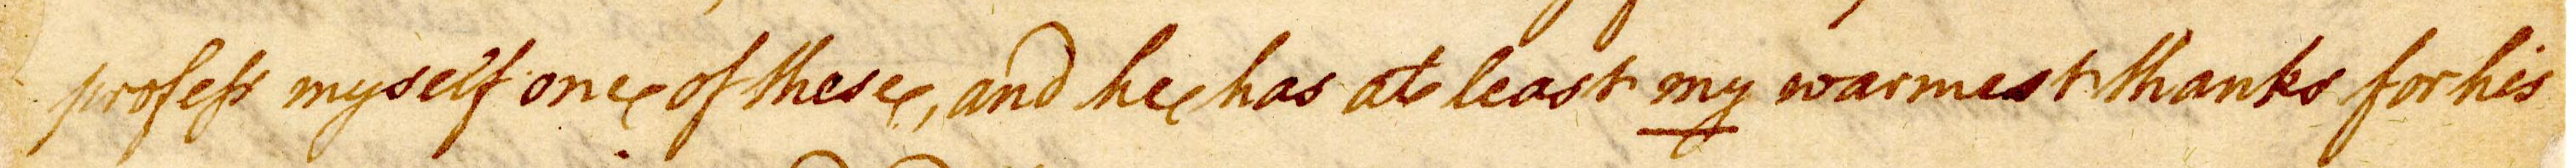profess myself one of these, and he has at least my warmest thanks for his
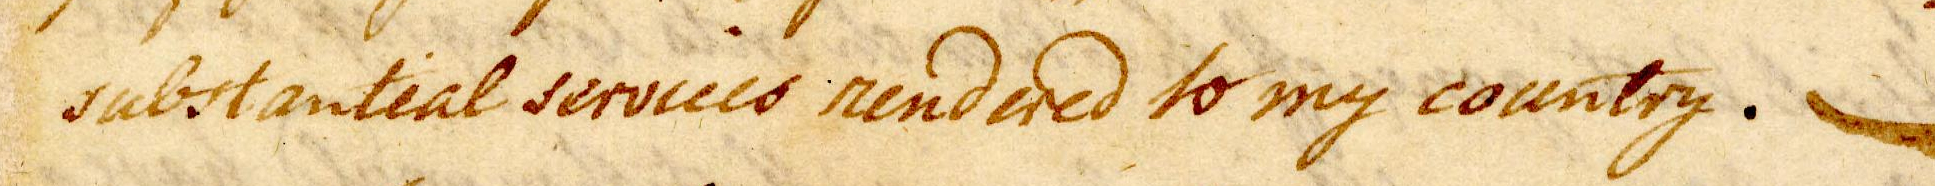substantial services rendered to my country.
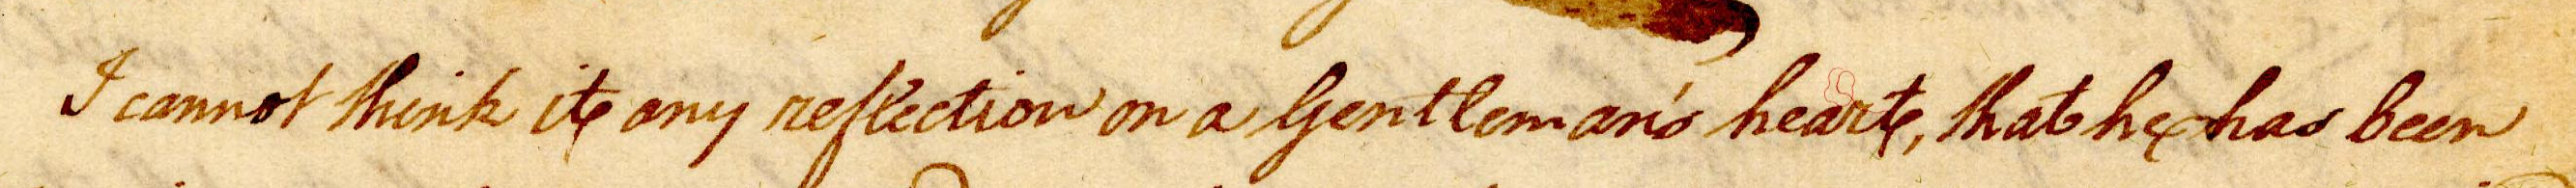I cannot think it any reflection on a Gentleman's heart, that he has been
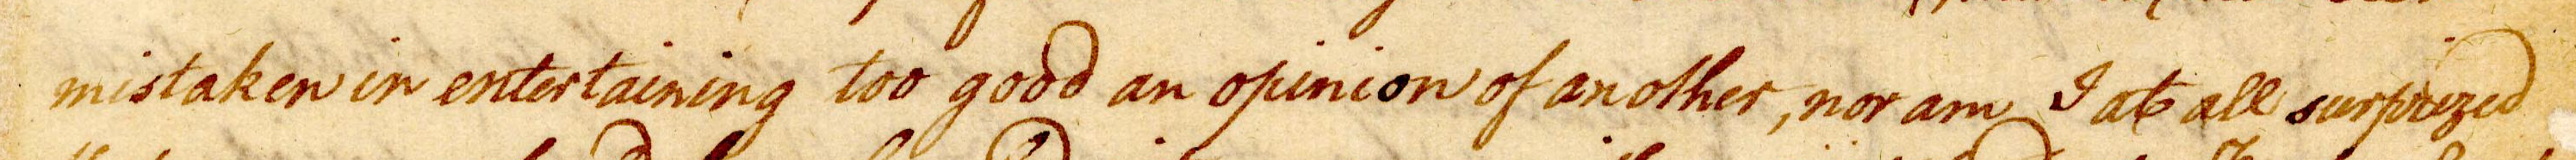mistaken in entertaining too good an opinion of another, nor am I at all surprised
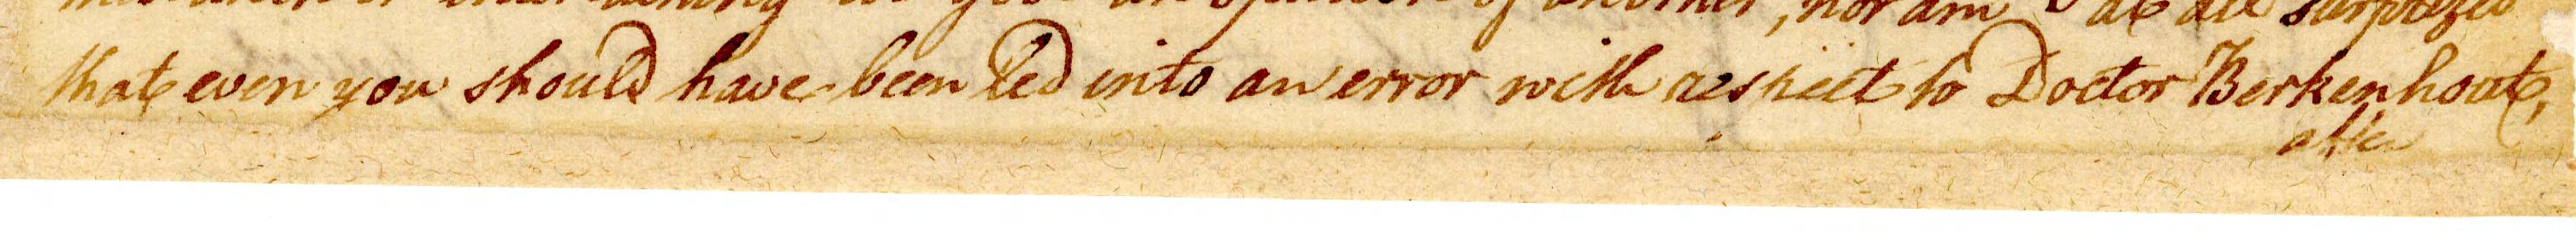that even you should have been led into an error with respect to Doctor Berkenhoat,
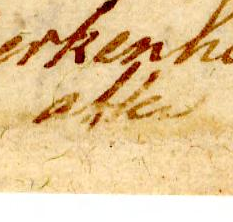often
